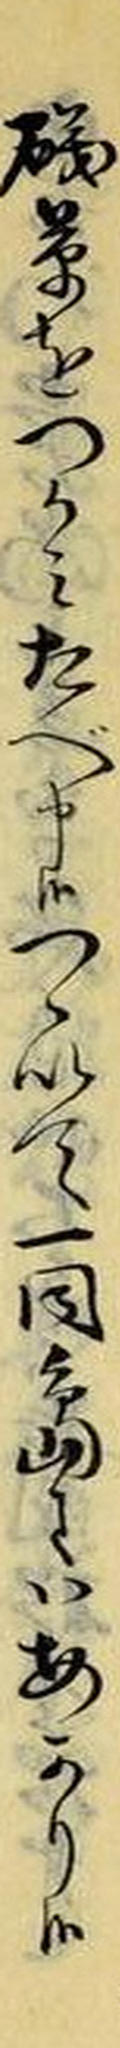磯草をつかミたべ申候つゝいて一同島にハあかり候
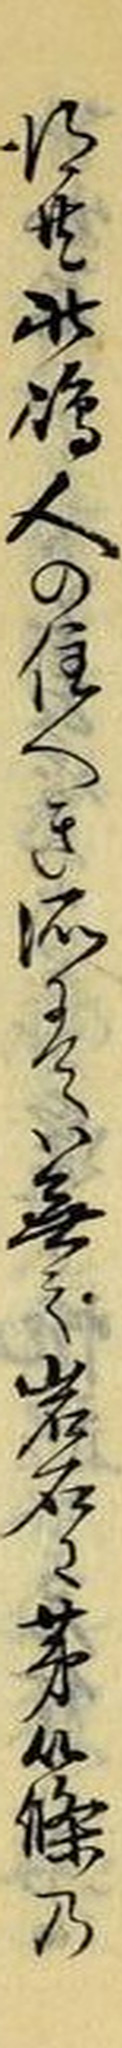得共此嶋人の住へき所にてハ無之岩石に茅篠の
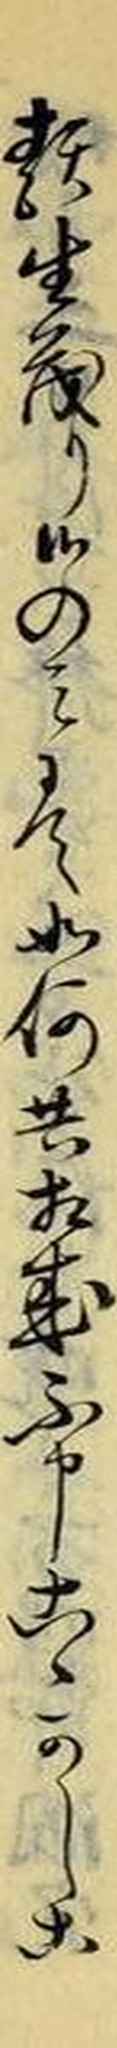類生茂り候のミにて如何共相成不申こゝかしこ
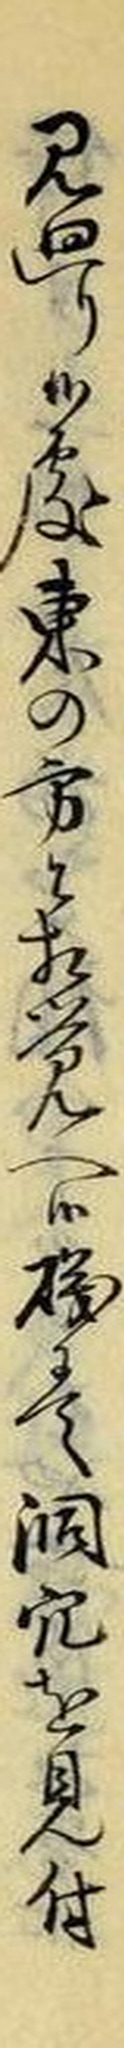見廻り候處東の方ニ相覚へ候磯にて洞穴を見付
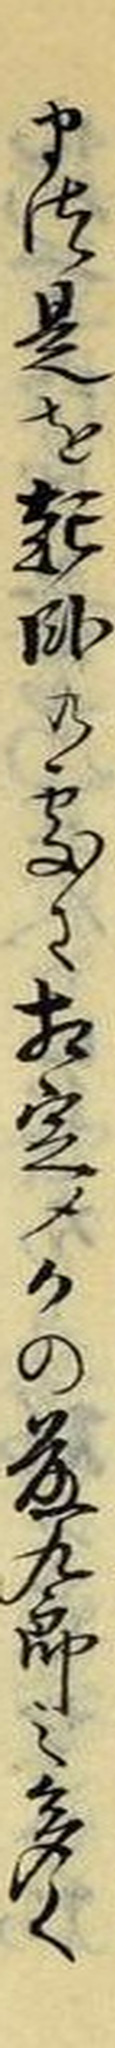まつ是を起臥の處に相定メかの藤九郎之多く
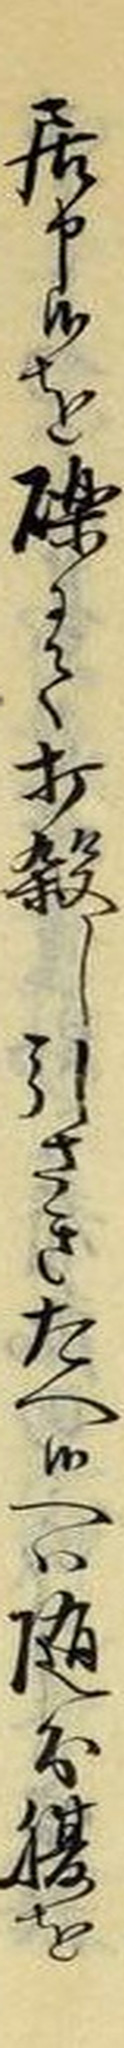居申候を礫にて打殺し引さきたへ候へハ随分腹を
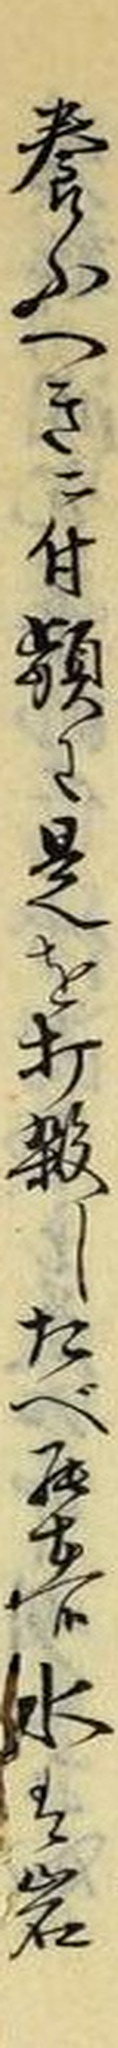養ふへきニ付頻に是を打殺したべ罷在候水は岩
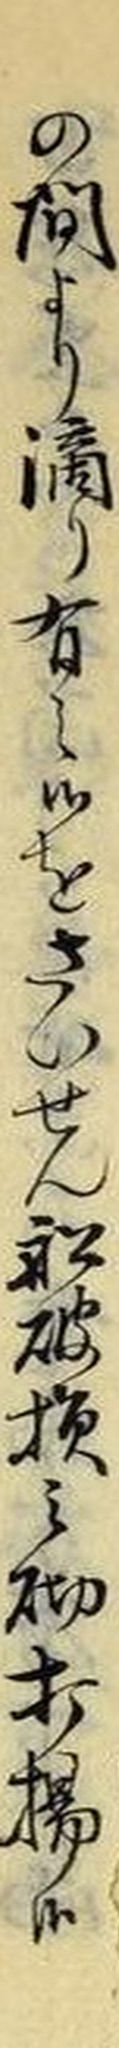の間より滴り有之候をさいせん船破損之砌打揚候
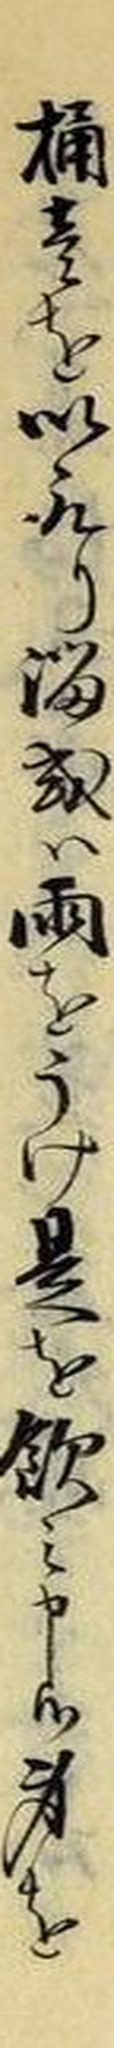桶臺を以取り溜或ハ雨をうけ是を飲ミ申候身を
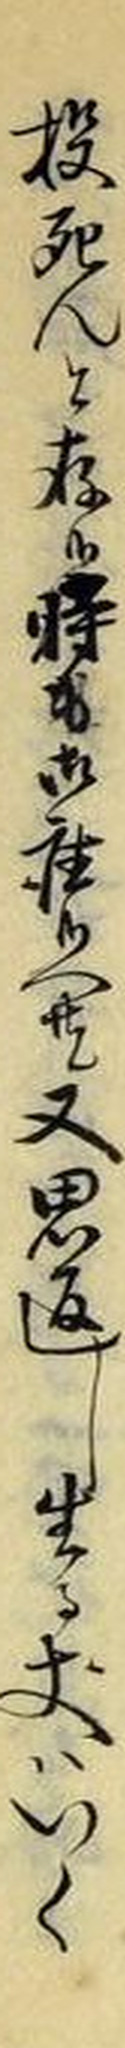投死んと存候時も御座候へ共又思返し生る丈ハいく
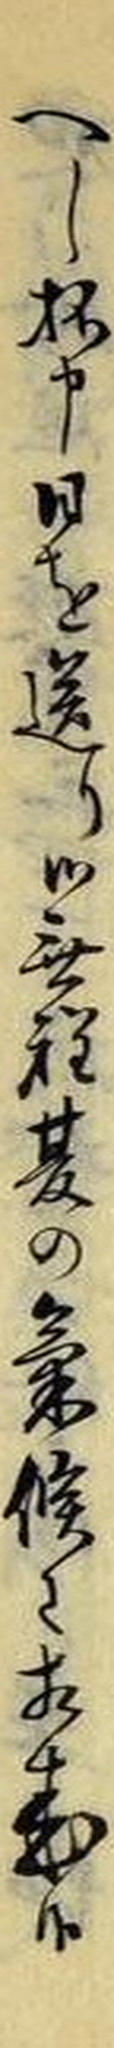へし抔申日を送り候無程夏の気候に相成候
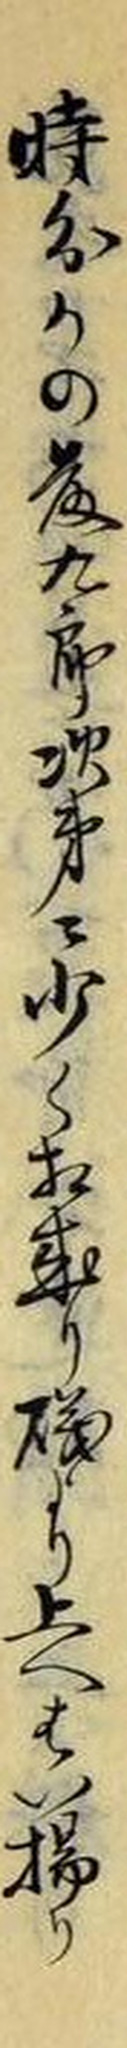時分かの藤九郎次第ニ少く相成り磯より上へはい揚り

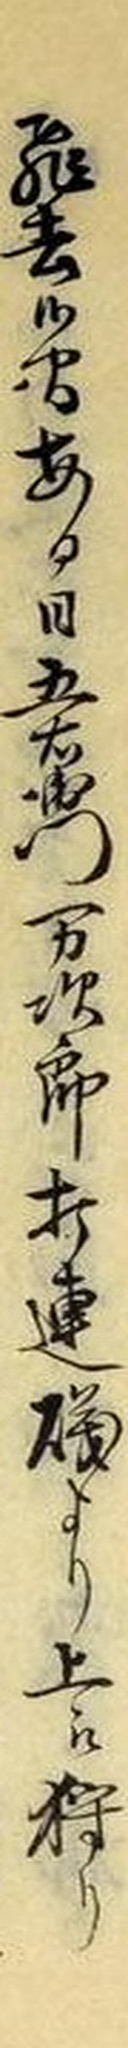飛去候間ある日五右衛門万次郎打連磯より上江狩り
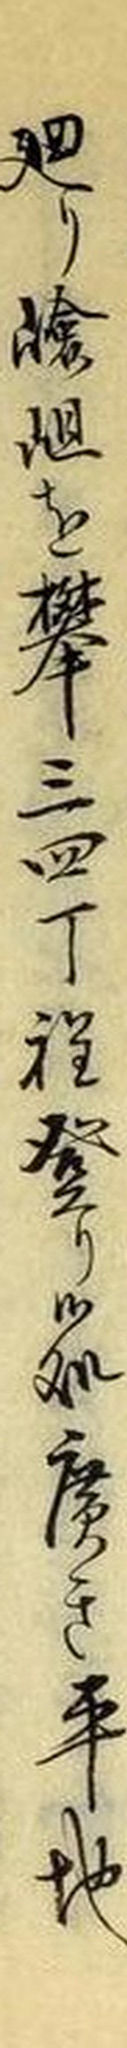廻り嶮岨を攀三四丁程登り候処広き平地
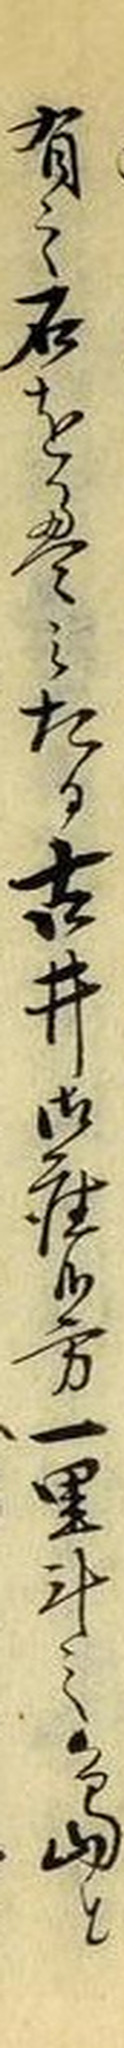有之石を畳ミたる古井御座候方一里計の島と
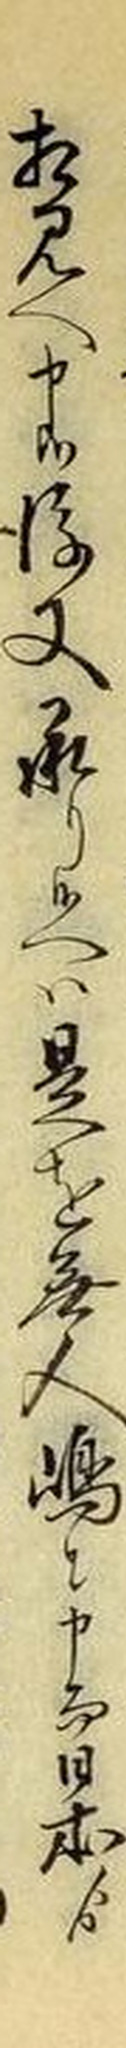相見へ申候後又承り候へハ是を無人島と申而日本ゟ
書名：漂客談奇（備考雑録写8）
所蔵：福井県文書館 Fukui Prefectural Archives
